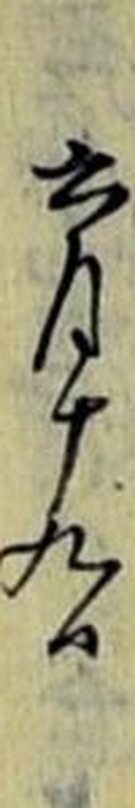六月十九日
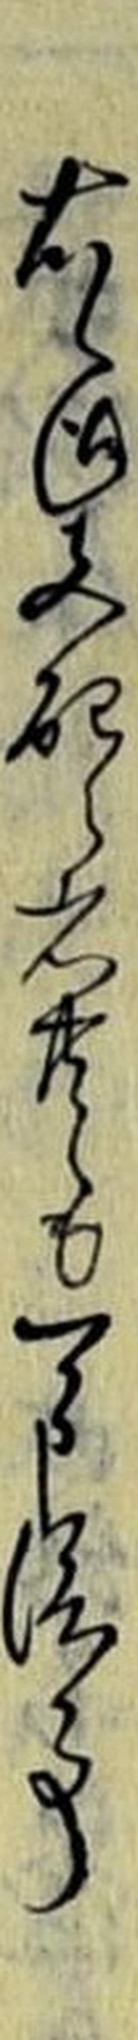右之通支配之者共へも可申渡事
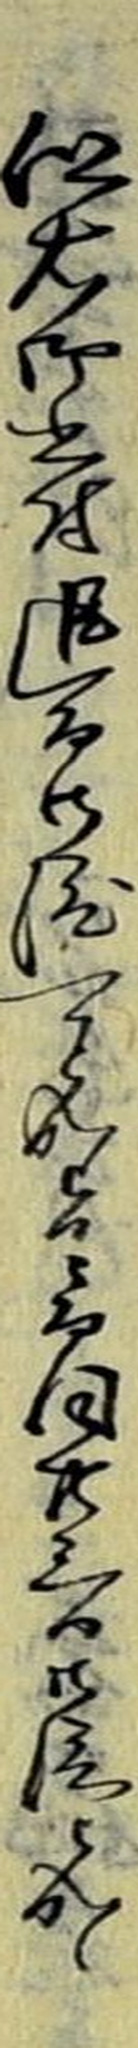但右御書付追而御渡可被成旨ニ而同廿三日御渡被成候
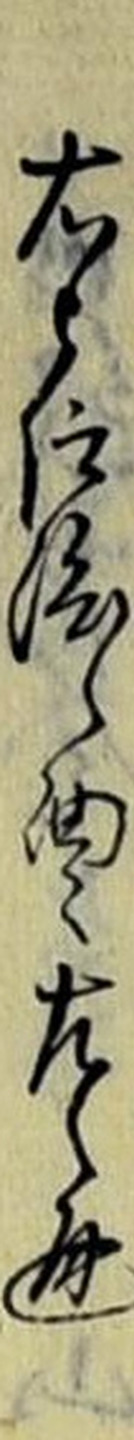右被仰渡候面々左之通
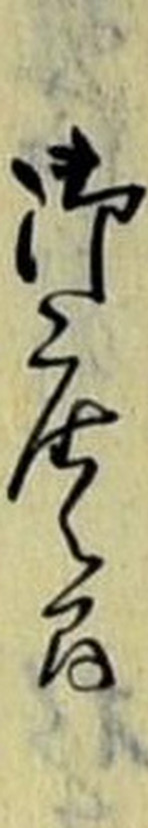御座之間
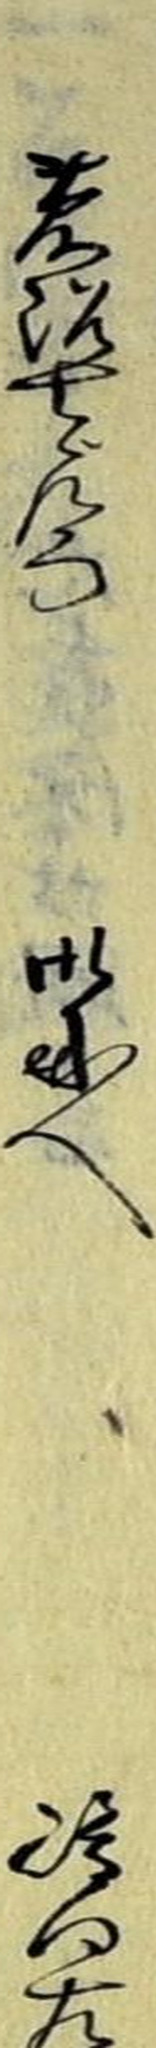菅沼七郎左衛門御用人嶋田左門
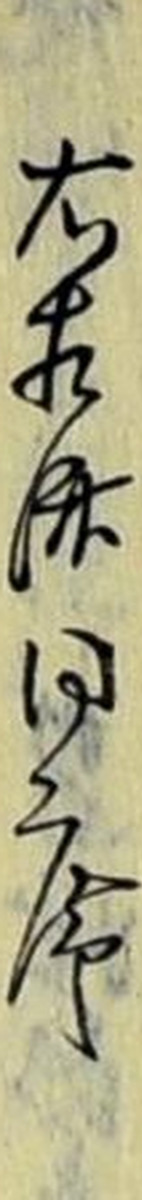右相済同席

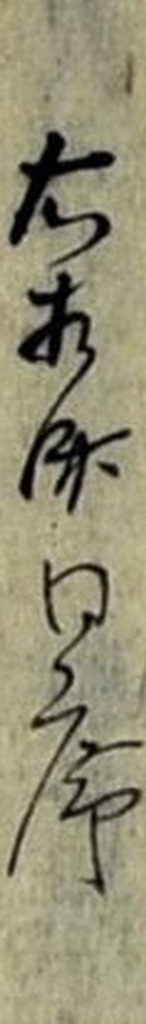右相済同席
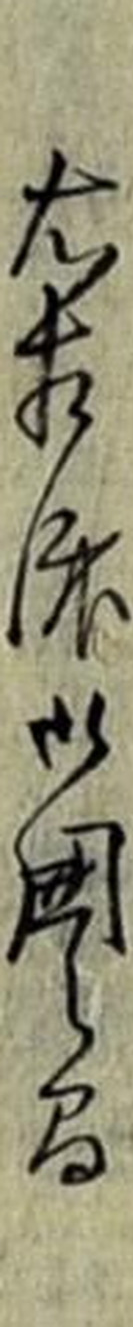右相済御囲之間
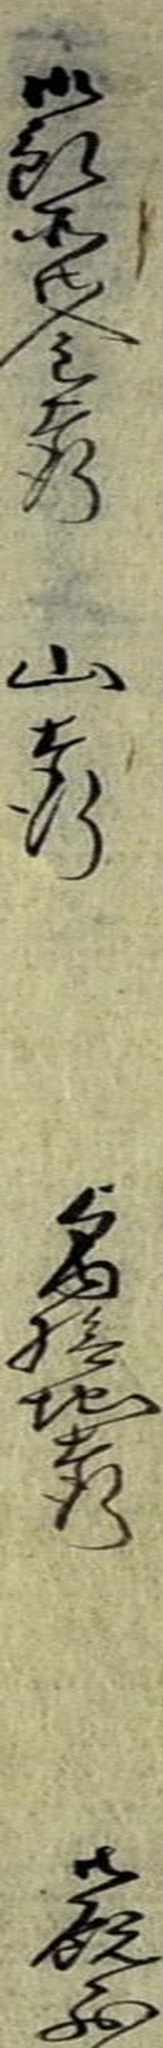御預所御金奉行山奉行与内検地奉行御厩別当役
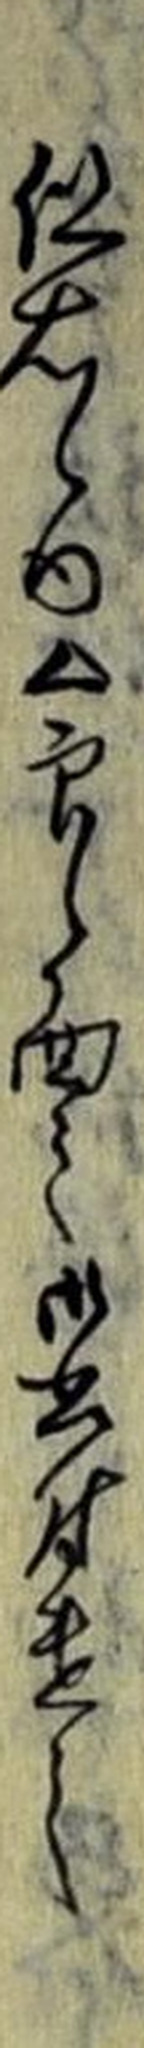但右之内△印之面々へ御書付遣之
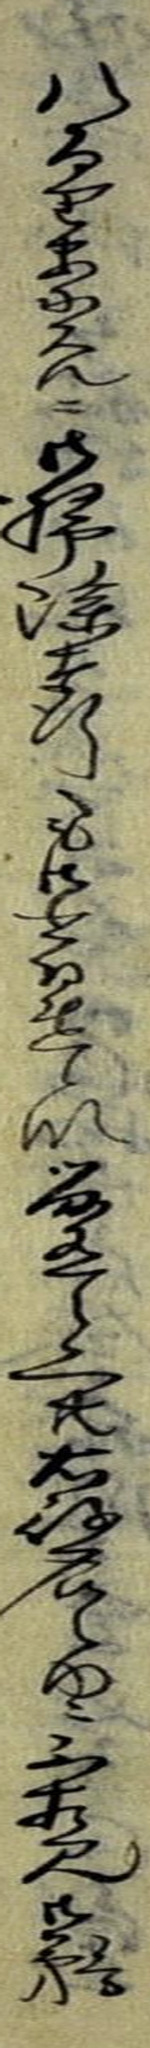八百里案スルニ御掃除奉行へも御書付遣候段留有之候へ共右役名之内にニ不相見御鵜
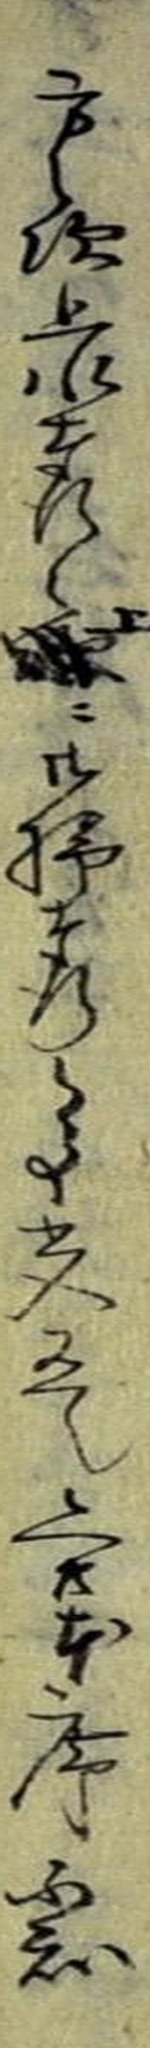方之次上水奉行之上ニ御掃奉行之事書入有之候へ共本席不知
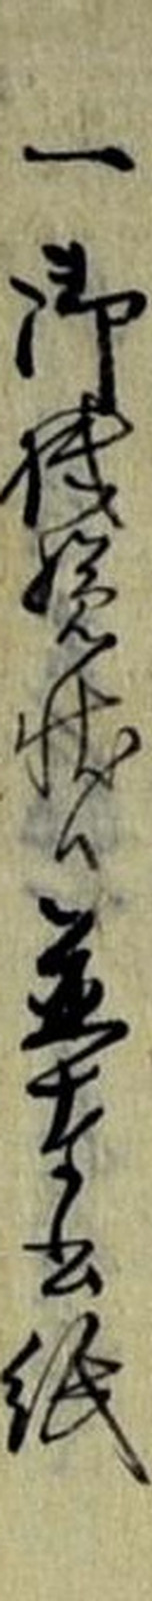一御機嫌状ハ並奉書紙
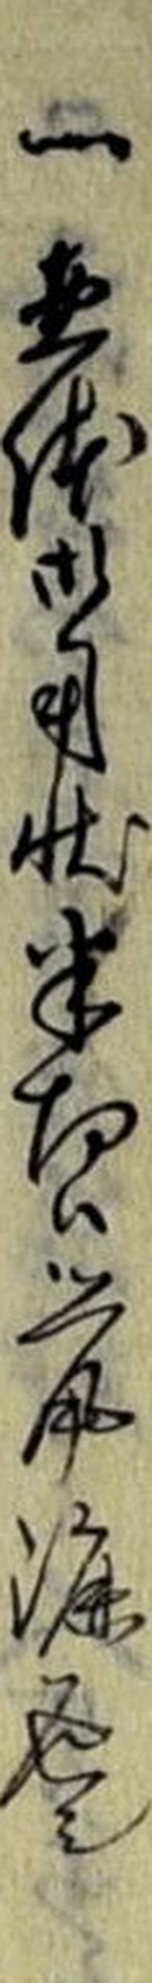一惣体御用状半切ハ鼠漉返シ
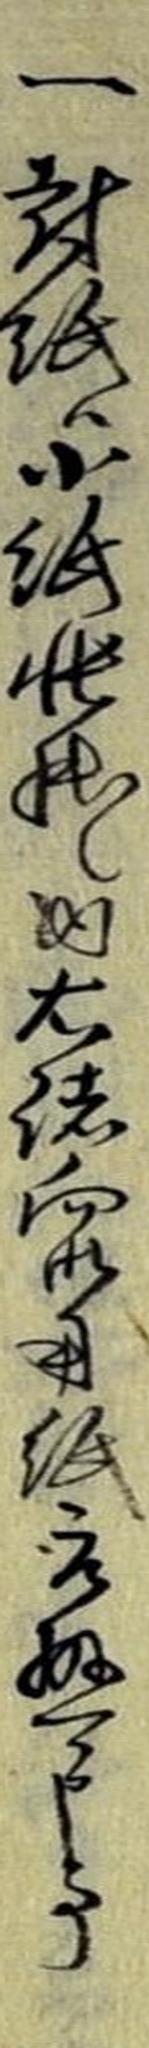一紙ハ小紙帳紙之内右諸向御用紙取扱可申事
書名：命令之部 三
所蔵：福井県文書館 Fukui Prefectural Archives
